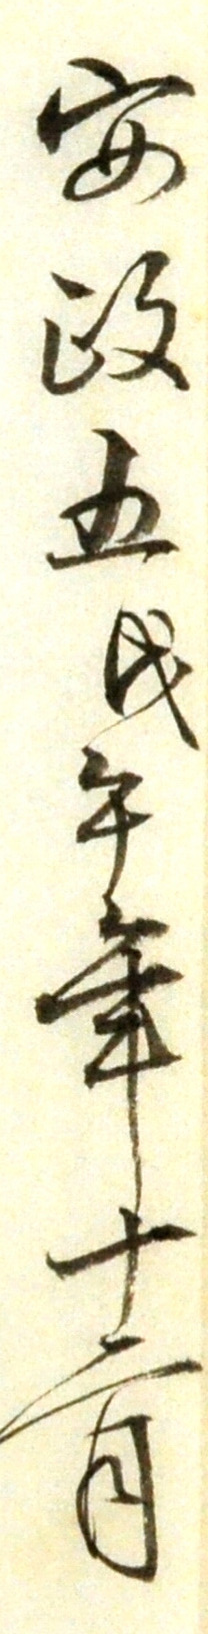安政五戊午年十二月
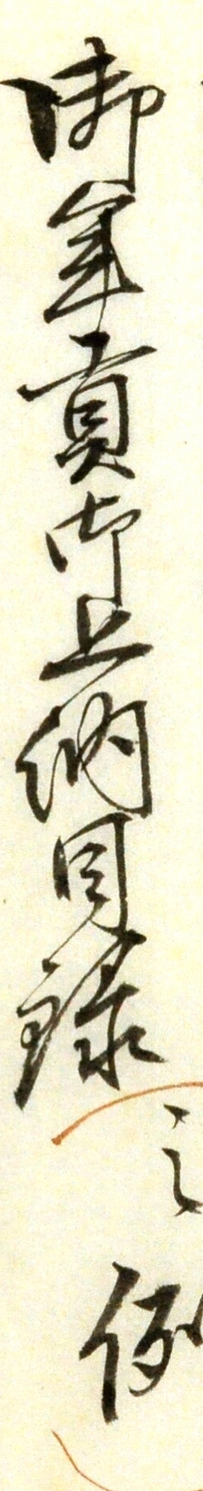御年貢御上納目録
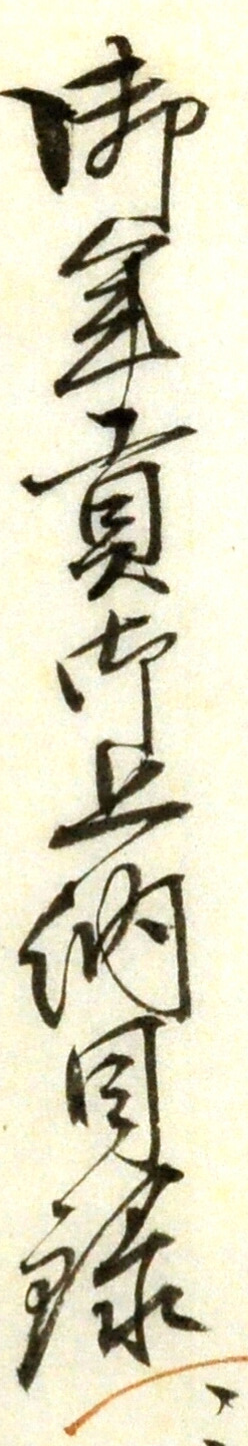御年貢御上納目録

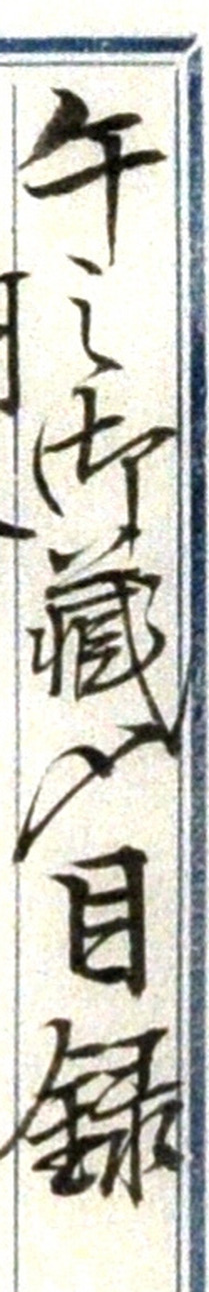午之御蔵〆目録
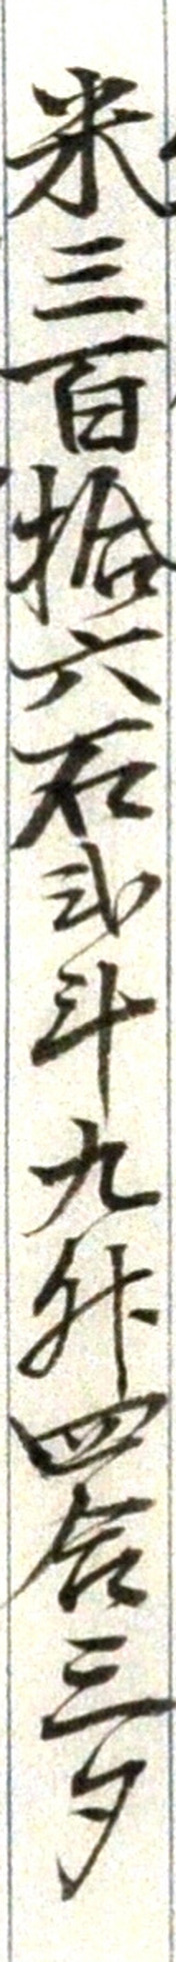米三百拾六石弐斗九升四合三勺
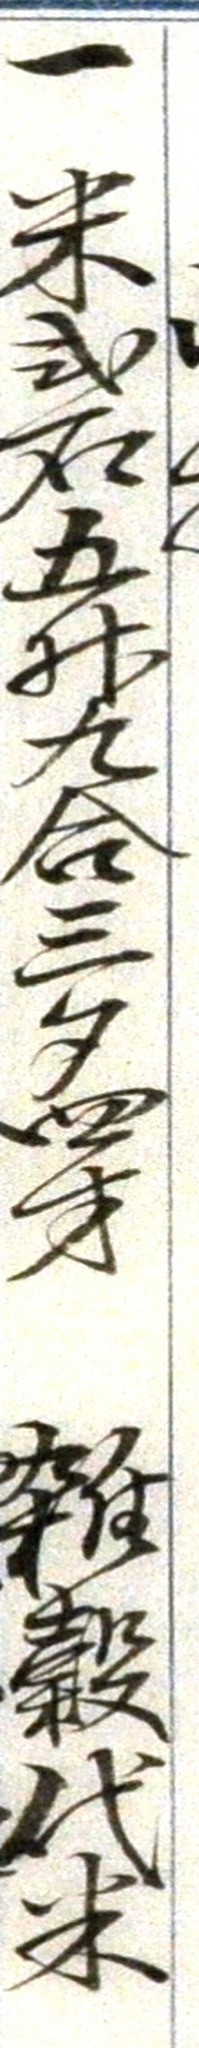一米弐石五升九合三勺四才雑穀代米
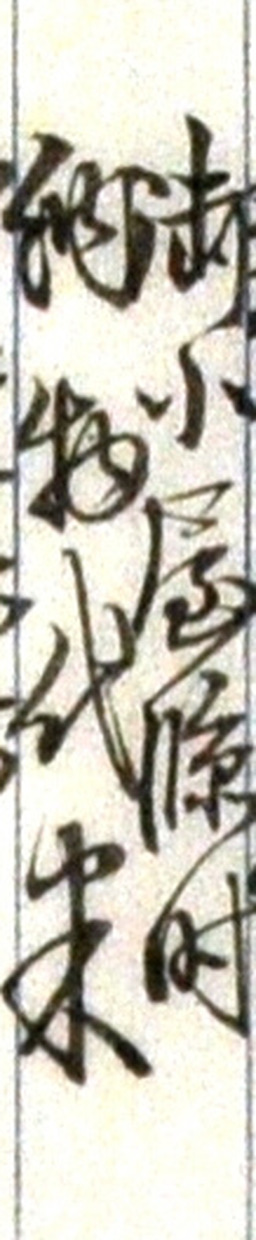納物代米
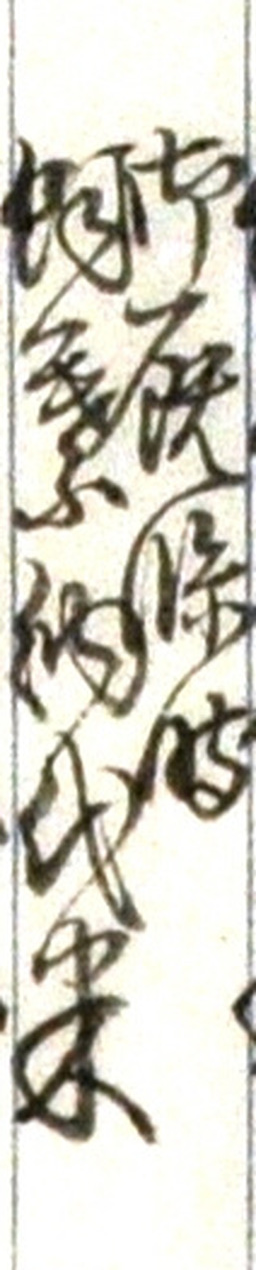飼葉納代米
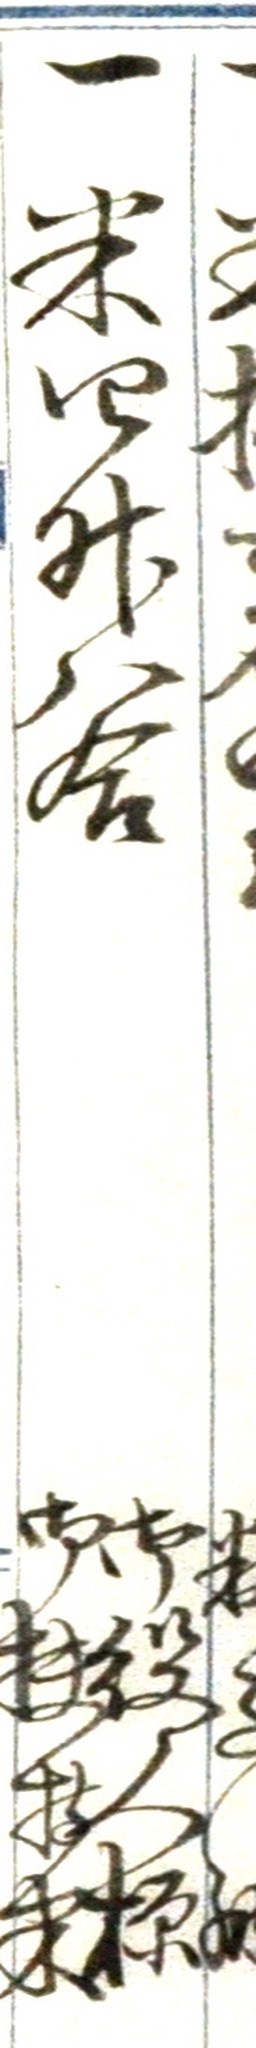一米四升八合御役人様

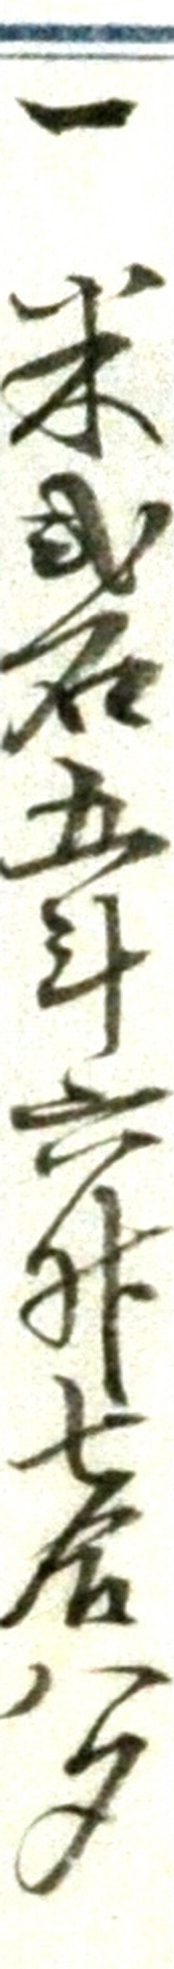一米弐石五斗六升七合八勺金納
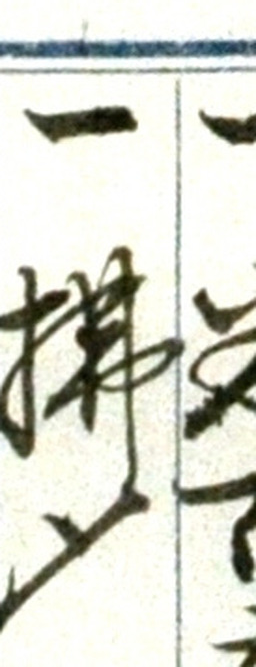一払〆
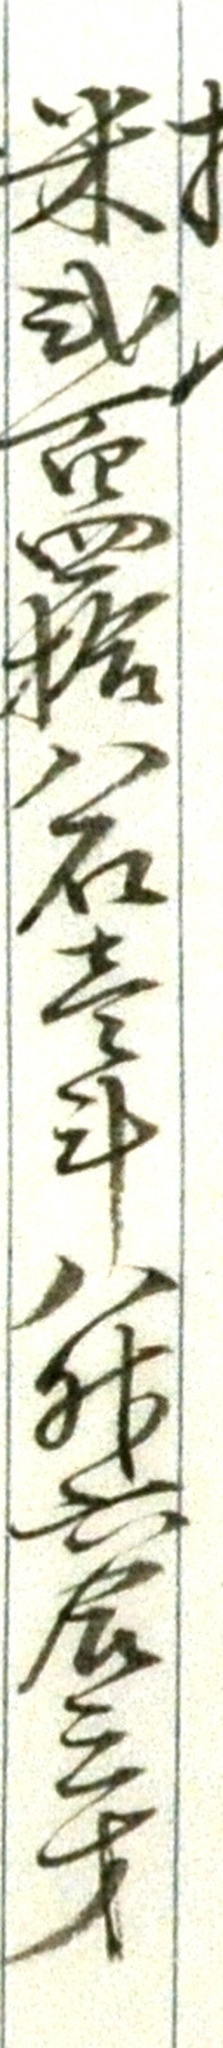米弐百四拾八石壱斗八升六合三才
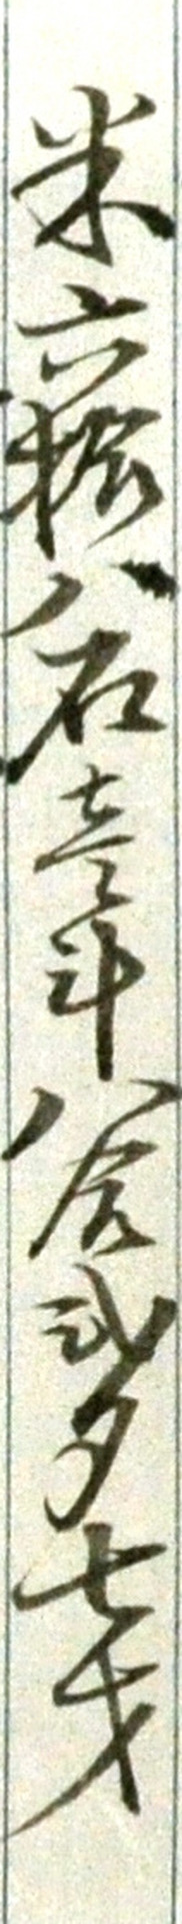米六拾八石壱斗八合弐勺七才
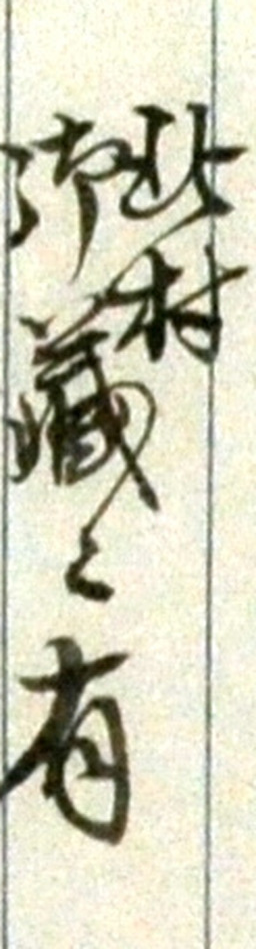御蔵ニ有
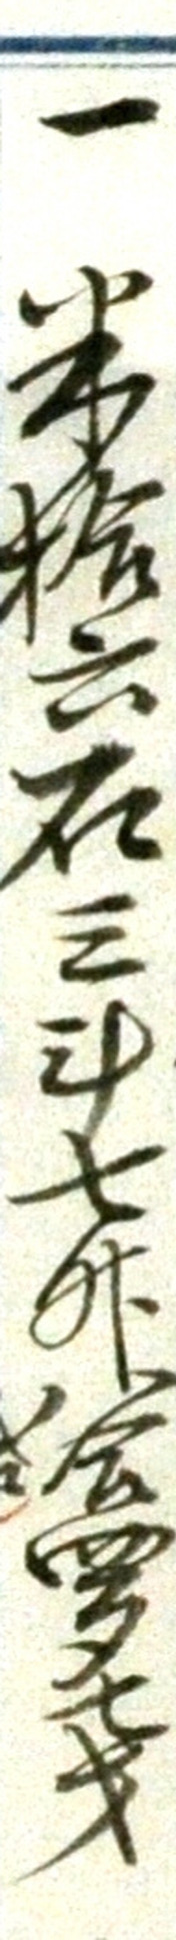一米拾六石三斗七升八合四勺七才北村
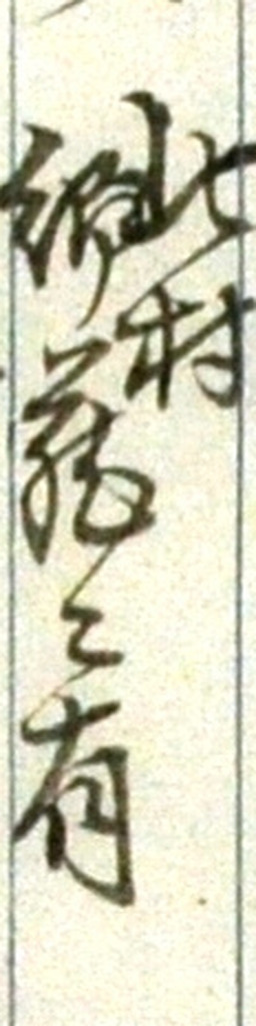御蔵ニ有
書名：御蔵〆目録・御年貢御上納目録
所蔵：伊那市立高遠町図書館・合同会社AMANE
